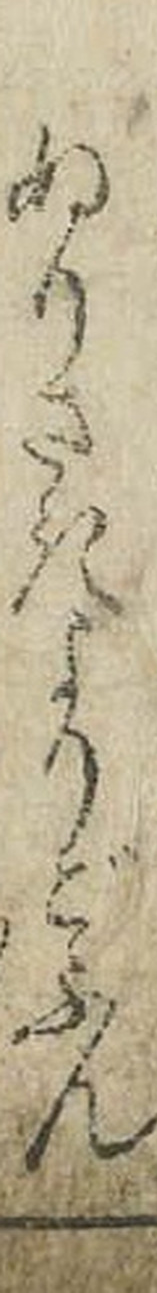ぬりさきよりごふん
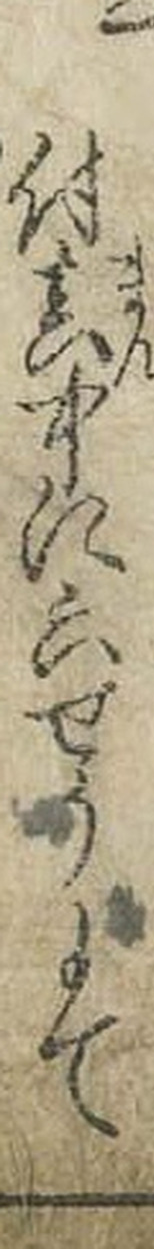付真中に六せうにて
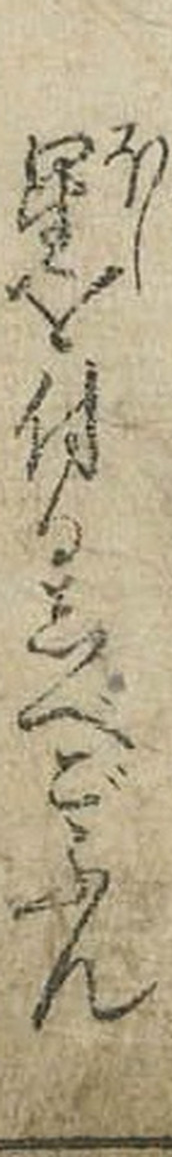星を付るしべごふん
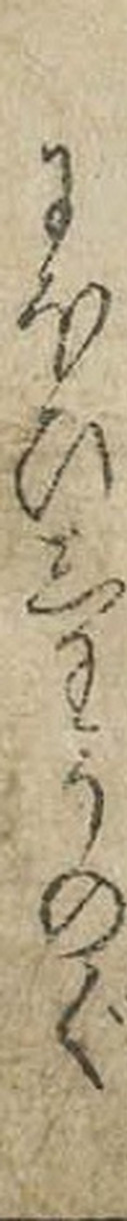にほひしわうのぐ

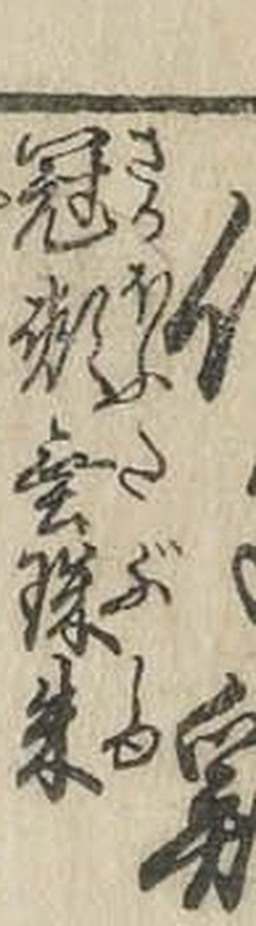冠頬垂珠朱
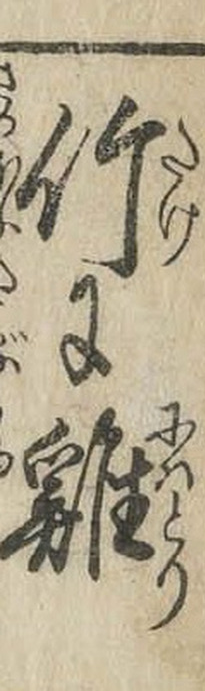竹に雞
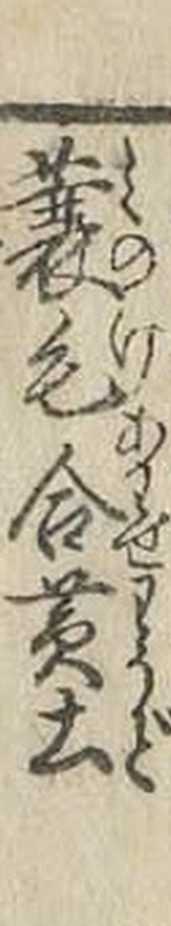簑毛合黄土
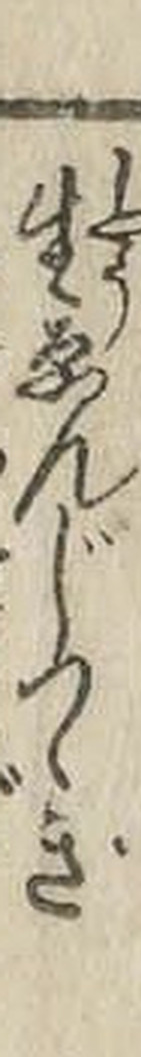生ゑんじつゝき
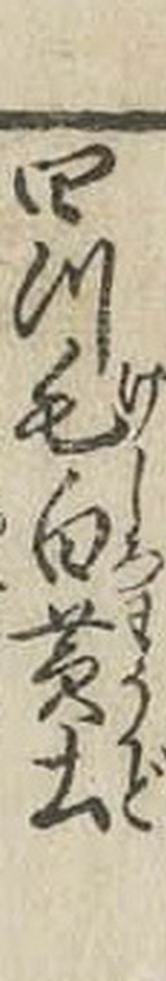四つ毛白黄土
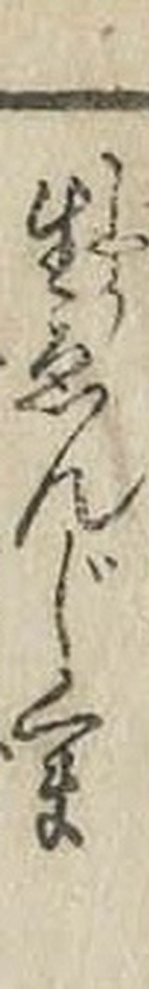生ゑんじくま
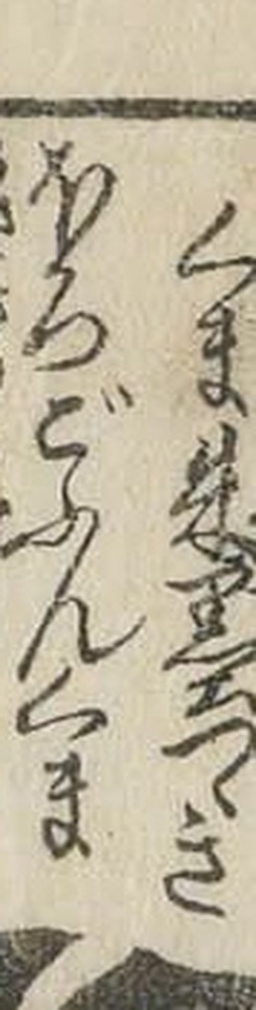ほろごふんくま
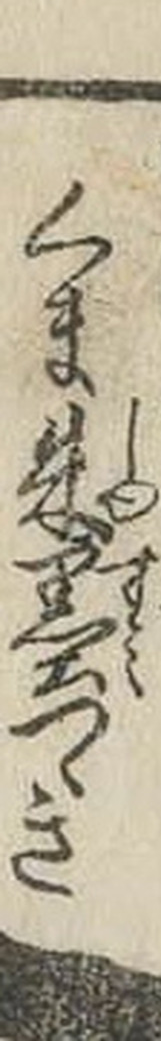くま朱墨つゝき
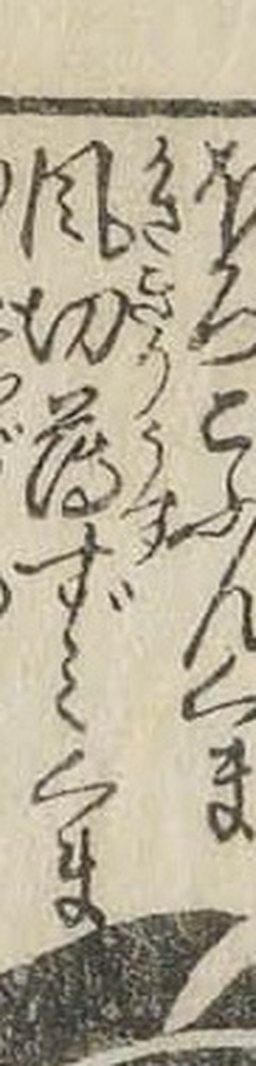風切薄ずみくま
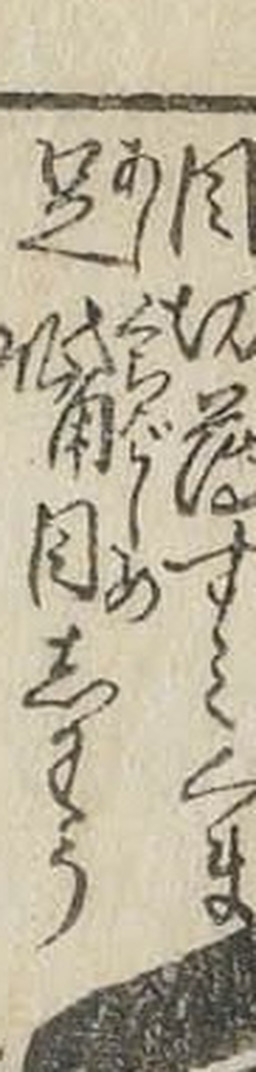足嘴目しわう
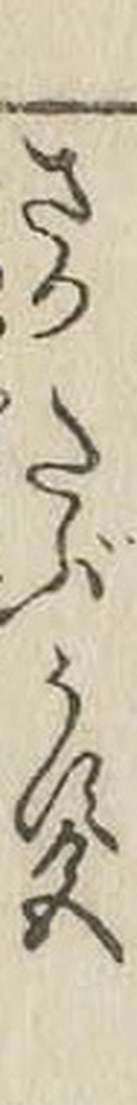さかたぶうす色
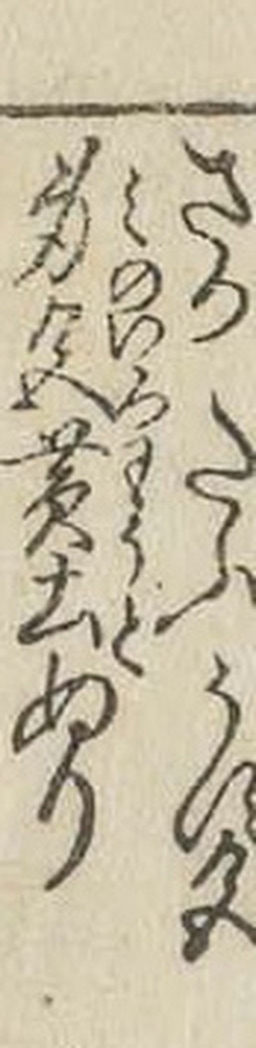身色黄土ぬり
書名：絵本写宝袋 9巻 8之巻
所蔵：東京学芸大学教育コンテンツアーカイブ
